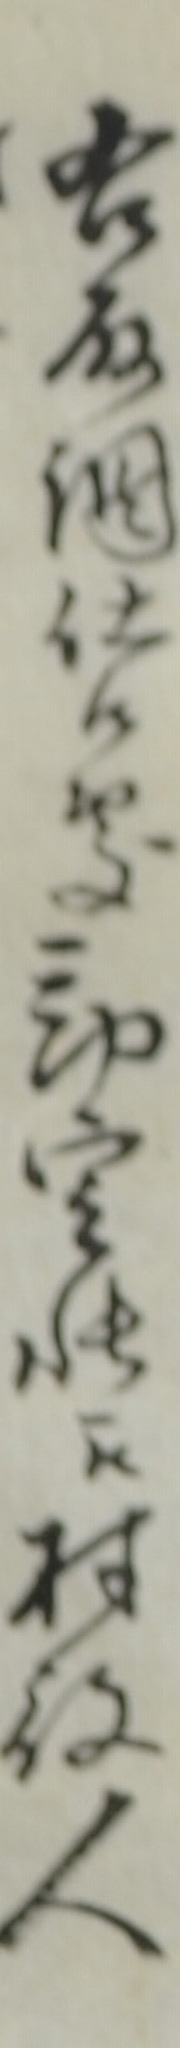右取調仕候処勘定帳江村役人
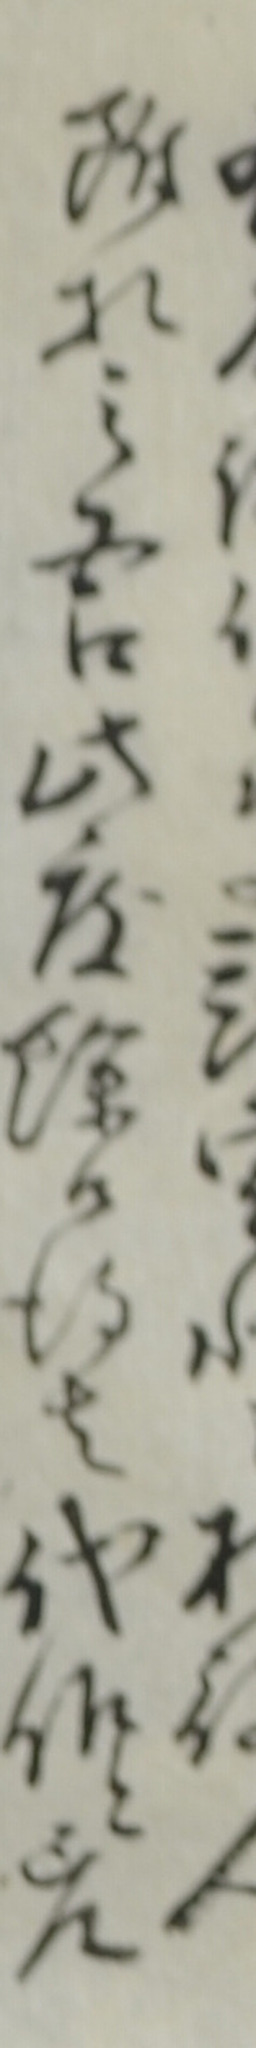附札之節此度除候得は代作ニ差
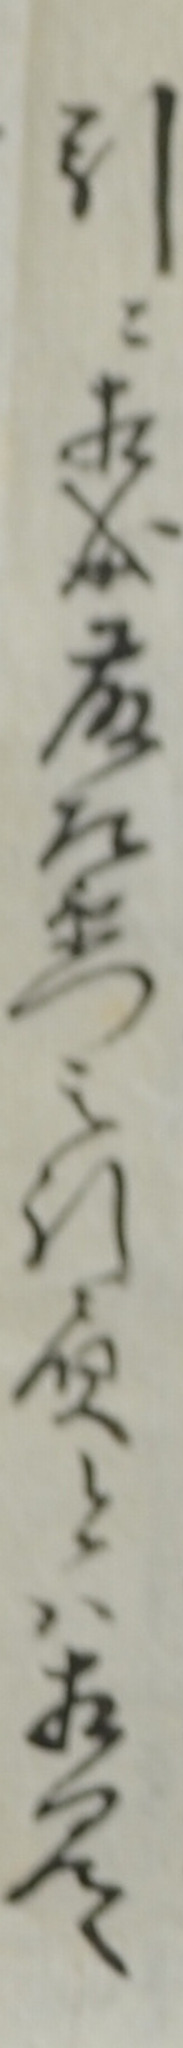引ニ相成藤左衛門之引負とハ相見へ
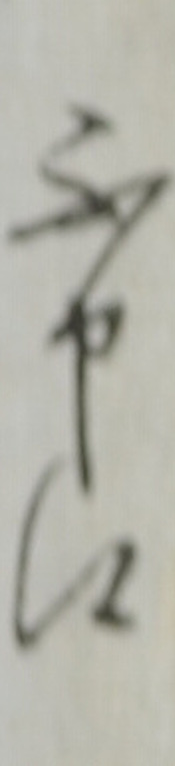不申候

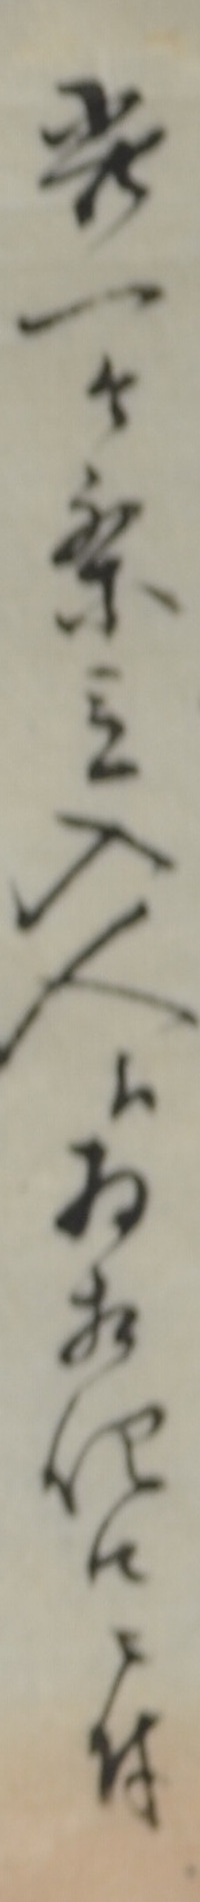此一ケ条立入人江為相記候ニ付
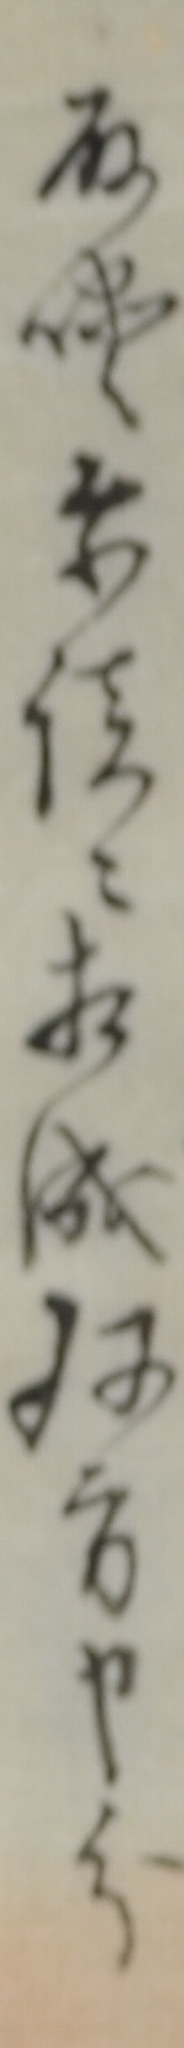取唱噯示談ニ相成双方申分
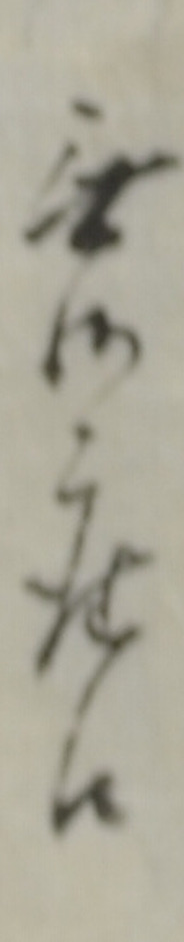無御座候
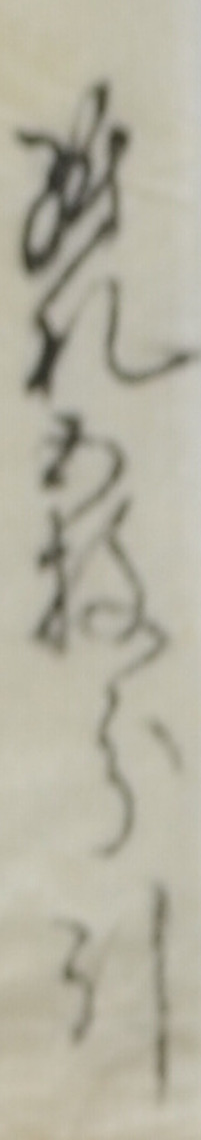附札五枚分引
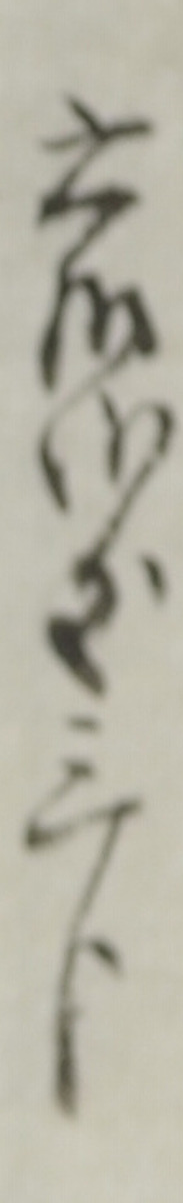六拾弐匁三分
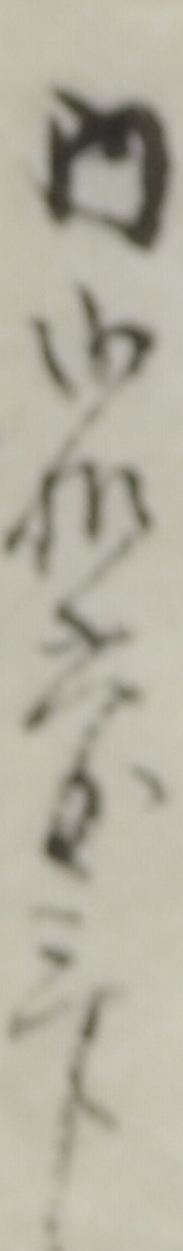内弐拾六匁三分
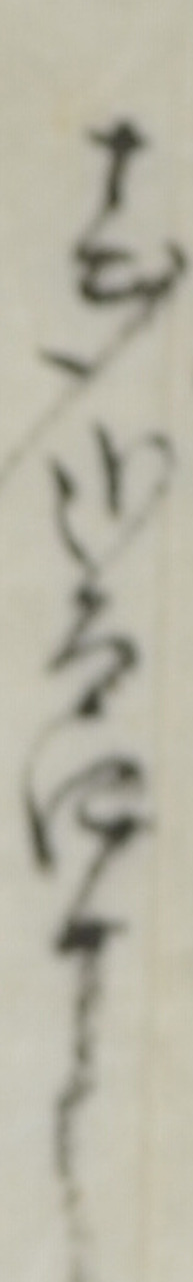〆三貫弐百四十文
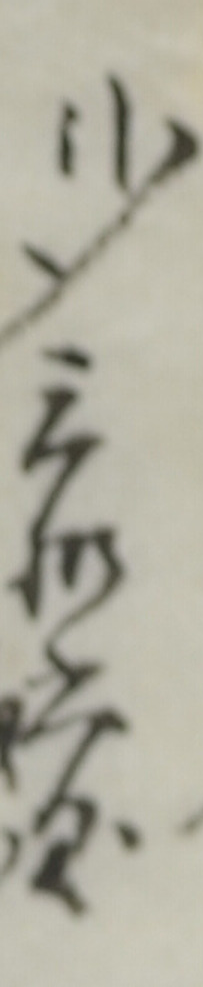引貫三拾六匁
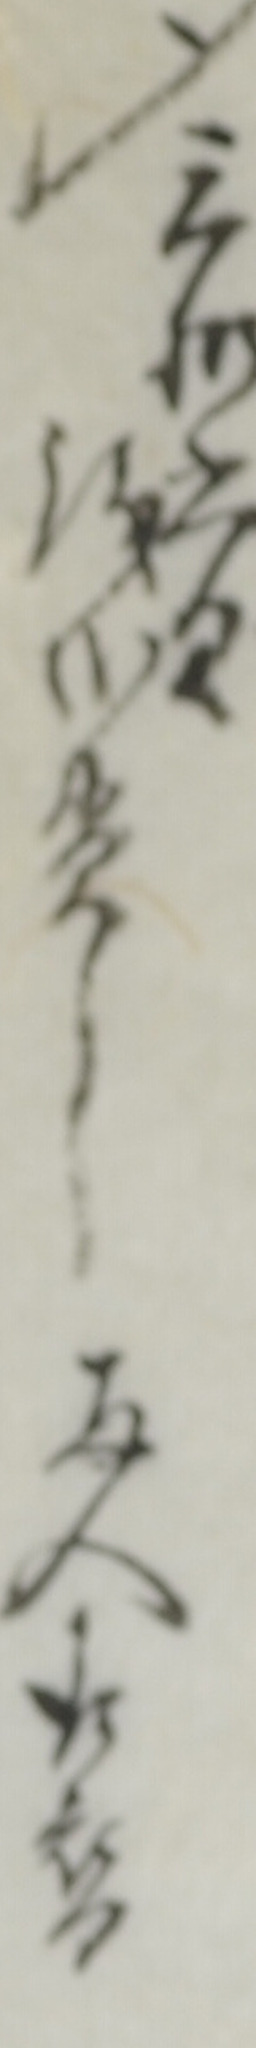銭弐貫文両人取替
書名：（付札一括）
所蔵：伊那市立高遠町図書館・合同会社AMANE
